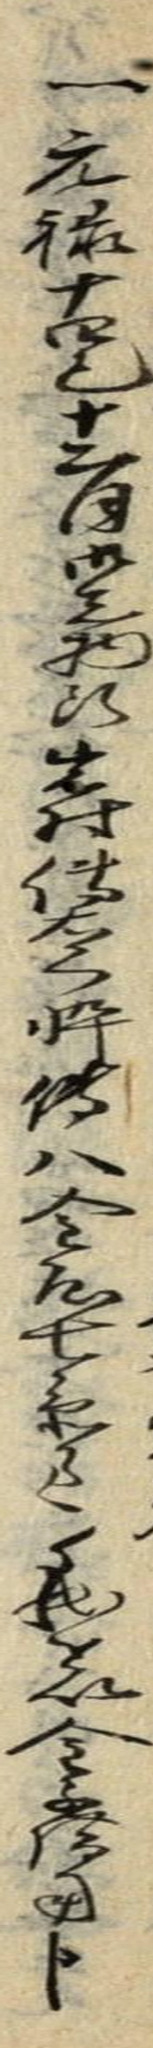一元禄十四巳十二月御先物頭岩村伝右衛門悴伝八金屋七兵衛方へ手紙を以金子借用申
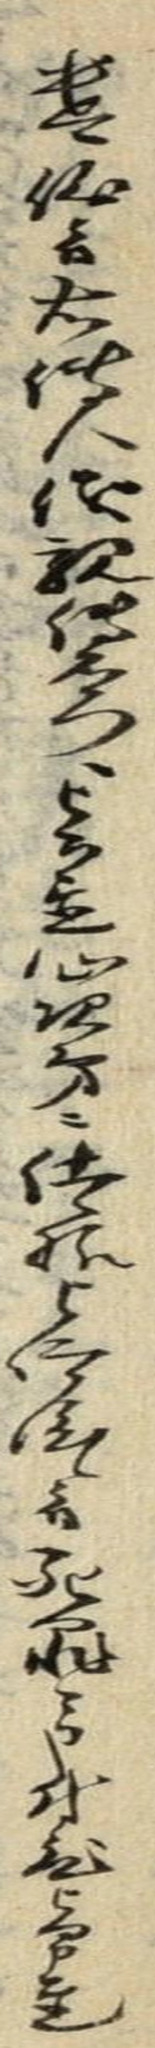遣候儀に付右伝八儀親伝右衛門へ被下置心次第に仕候様被仰渡候に付死罪に申付度旨申達
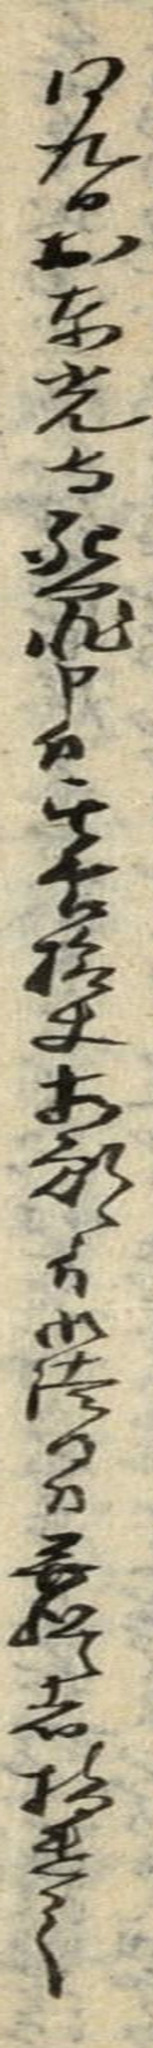同九日於東光寺死罪申付其節検使相願候に付御徒目付并組之者指遣之
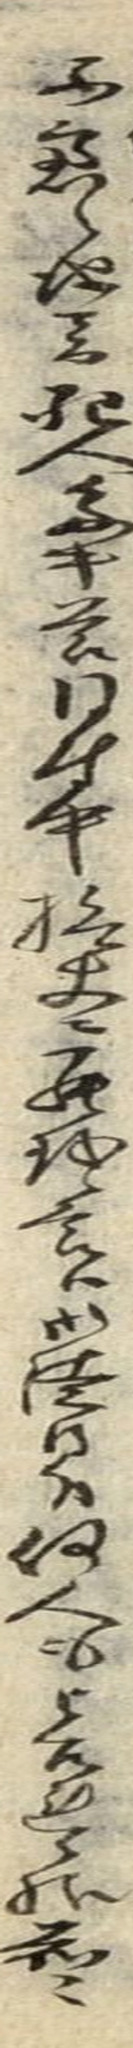不慮之儀にて死人多キ節目付中検使に罷越候節は御徒目付何人も被召連候様前々
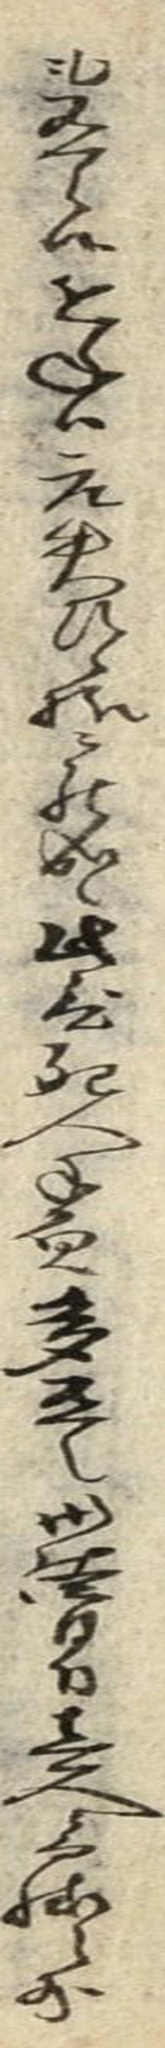も有之候近年は取失ひ候様に罷成候此度死人手負多有之御徒目付壱人にて殊之外
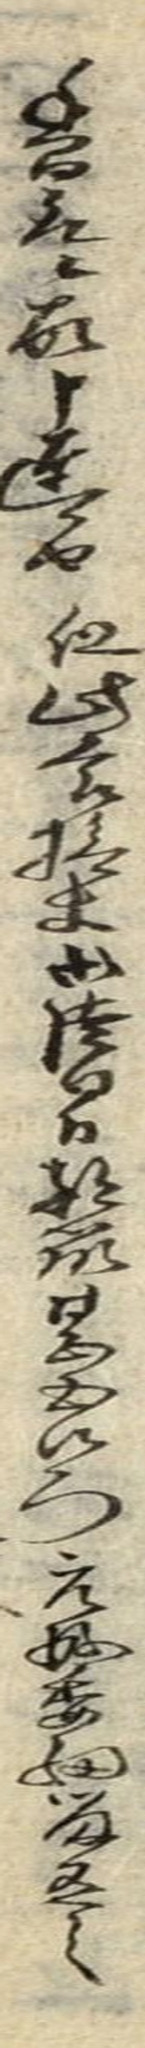手間取候故申達候由但此節検使御徒目付都筑甚五左衛門取扱委細留有之
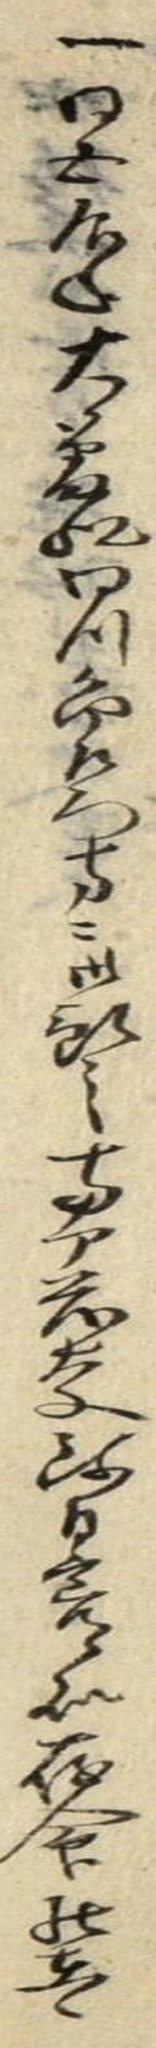一同五辰年大御番組田川角左衛門方に御預之南部茂大夫致自害候処存命罷在候

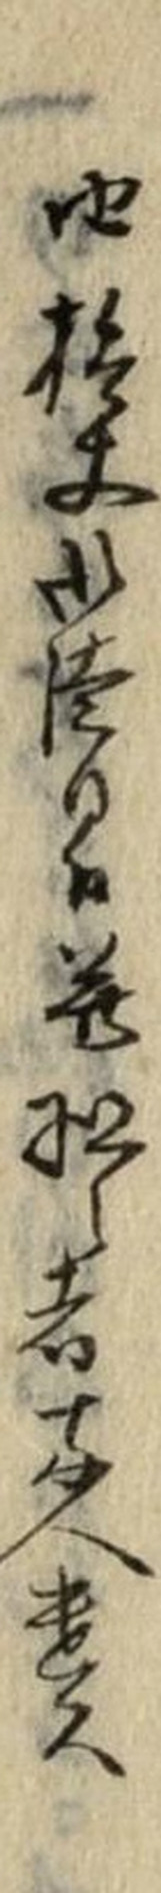由検使御徒目付并組之者両人遣ス
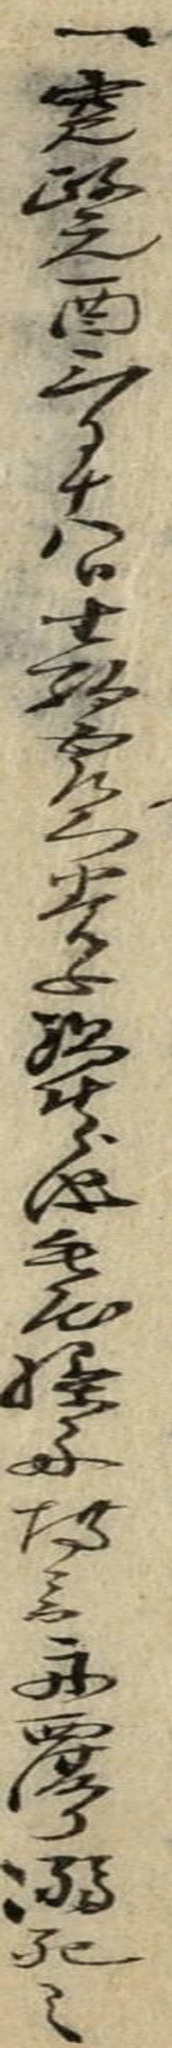一寛政元酉三月十八日生駒五左衛門養子鍋次郎儀毛屋繰舟場にて舟覆り溺死之
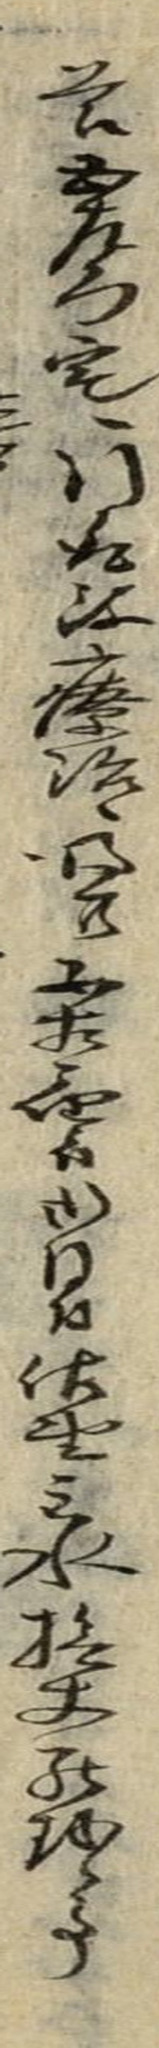節五左衛門宅へ引取致療治候得共不相届に付御目付佐野主水検使罷越候事
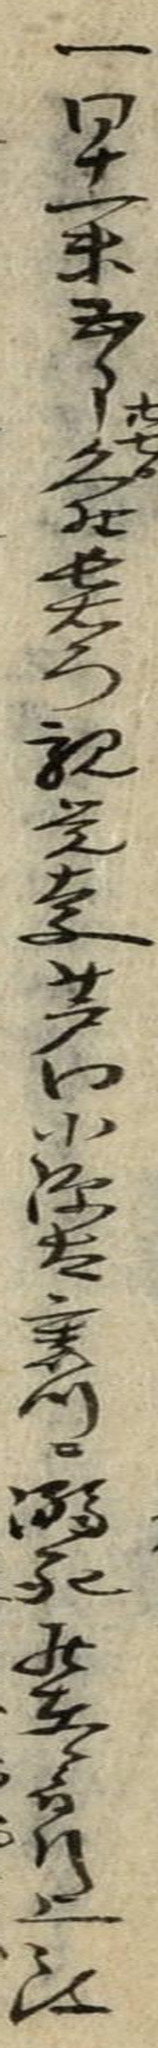一同十一未五月久廿七日野長右衛門親覚太夫芦田小源太裏川に溺死罷在候に付引上致
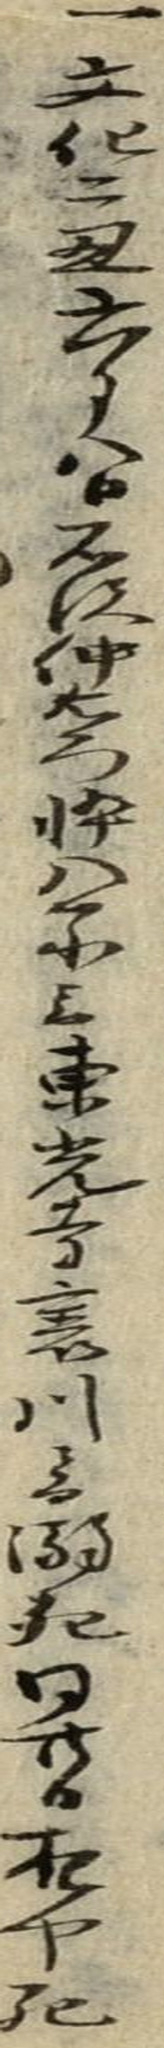一文化二丑六月八日石沢仲右衛門悴八東光寺裏川にて溺死同廿日夜中死
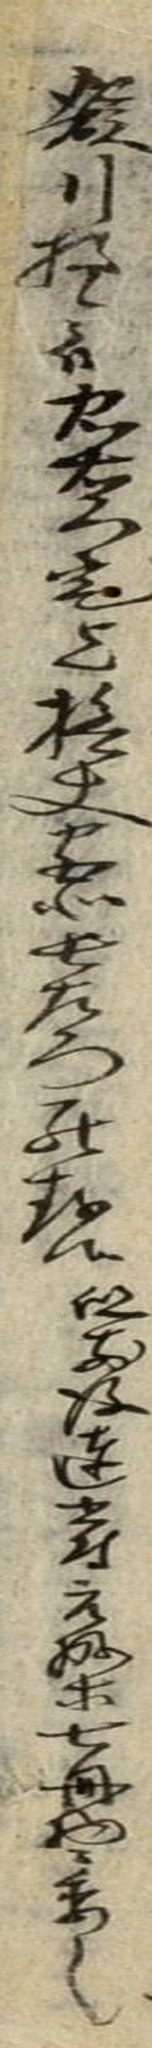骸引揚候に付忠右衛門宅迄検使宮北長左衛門罷越候但前後達書付取扱等七冊物に委之
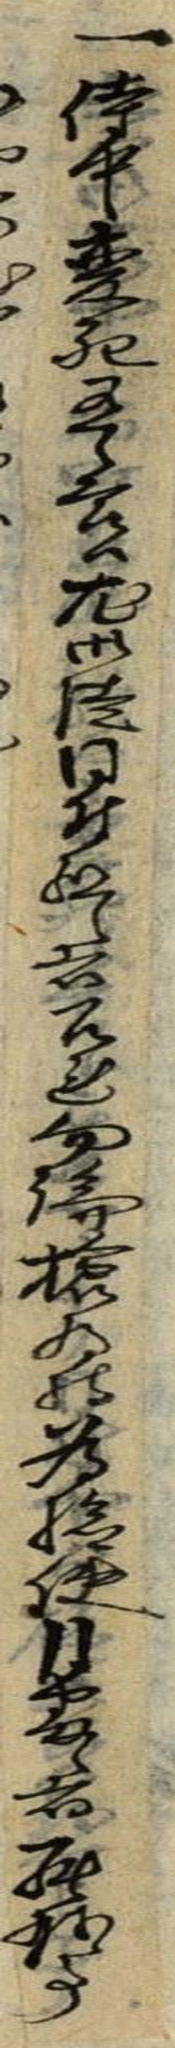一侍中変死有之節は尤御徒目付組之者召連勿論槍為持為検使月番之者罷越候事
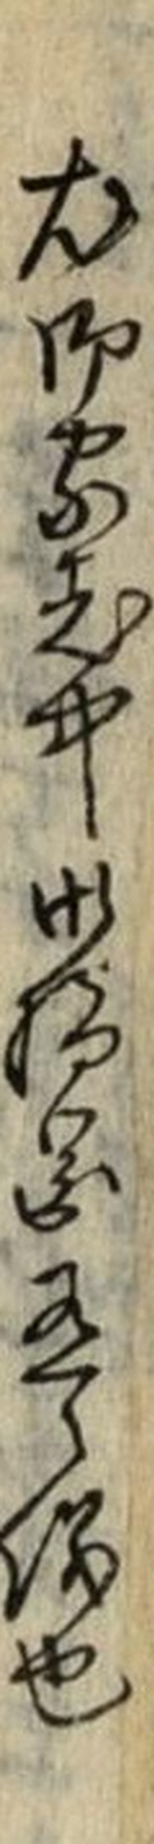尤御家老中御指図有之儀也
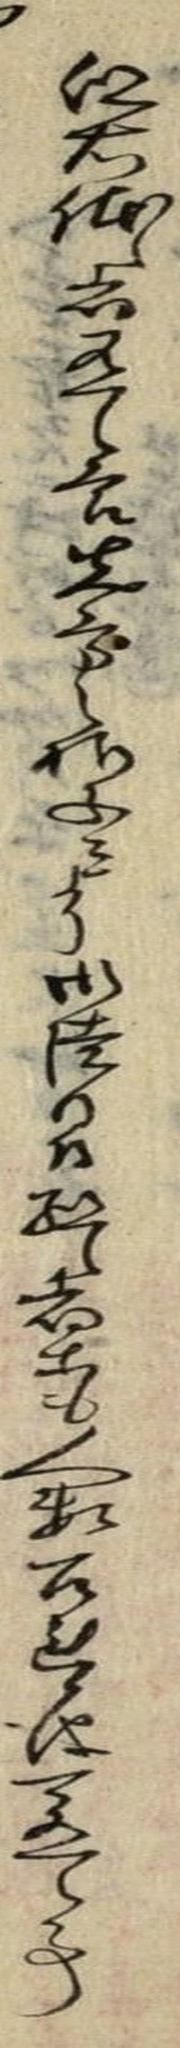但右体之者有之節先方之様子により御徒目付組之者等も人数召連候儀可有之事
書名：御停止異変死失
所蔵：福井県文書館 Fukui Prefectural Archives
